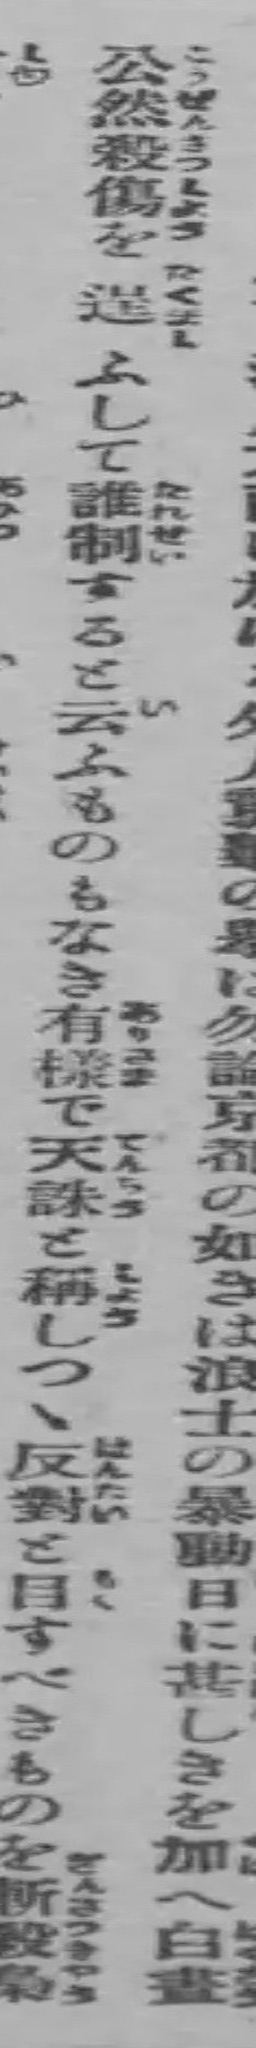公然殺傷を逞ふして誰制すると云ふものもなき有様で天誅と称しつゝ反対と目すべきものを惨殺梟
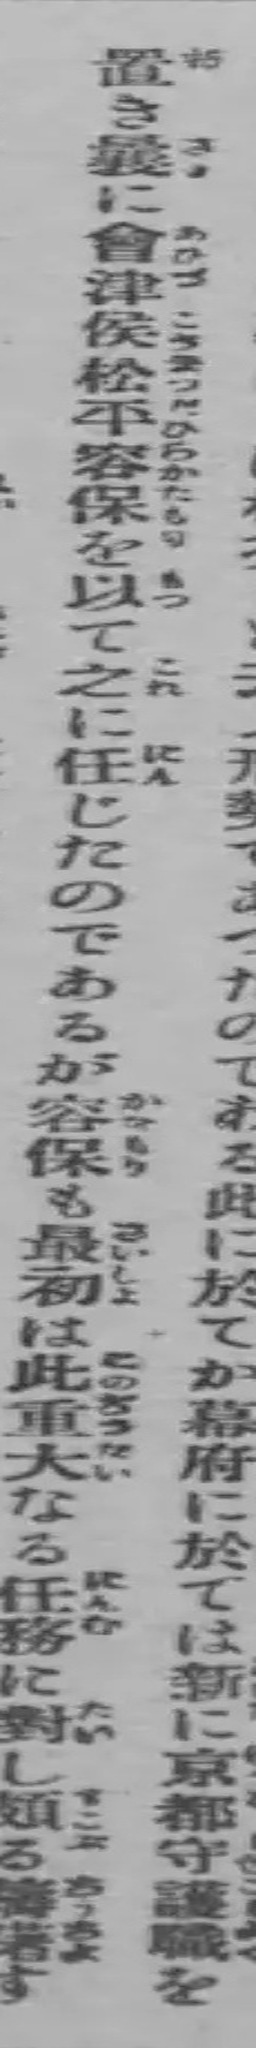置き曩に会津侯松平容保を以て之に任じたのであるが容保も最初は此重大なる任務に対し頗る躊躇す
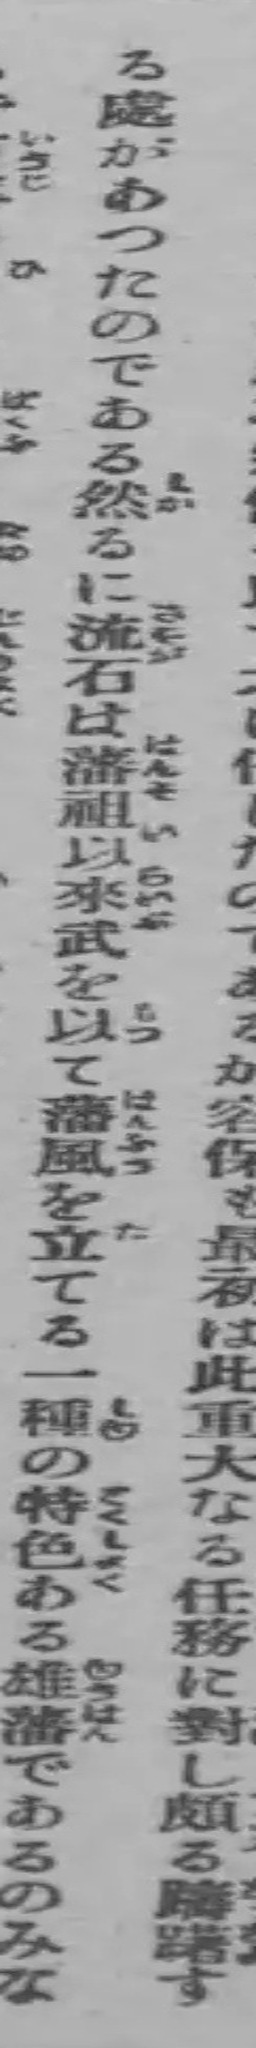る処があつたのである然るに流石は藩祖以来武を以て藩風を立てる一種の特色ある雄藩であるのみな
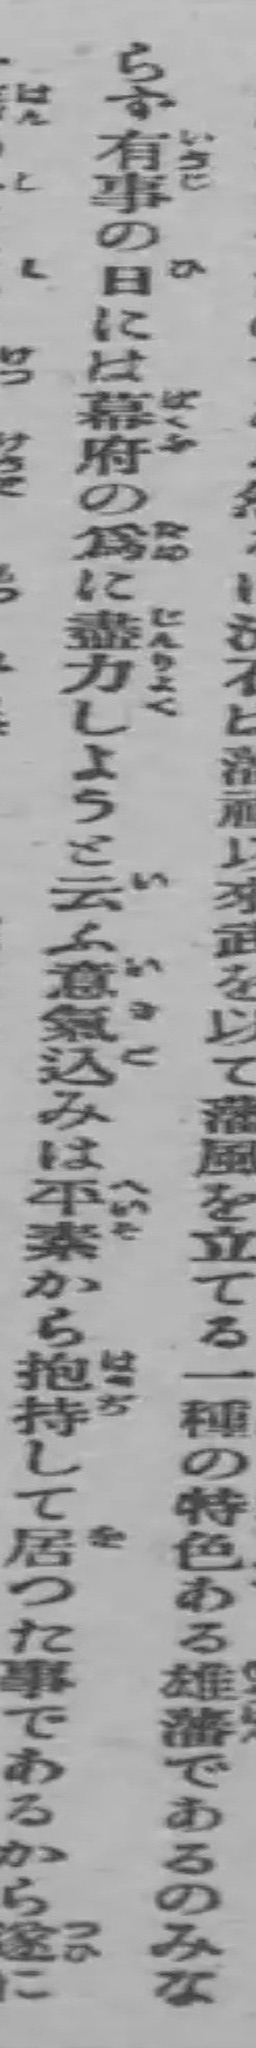らず有事の日には幕府の為に尽力しようと云ふ意気込みは平素から抱持して居つた事であるから遂に
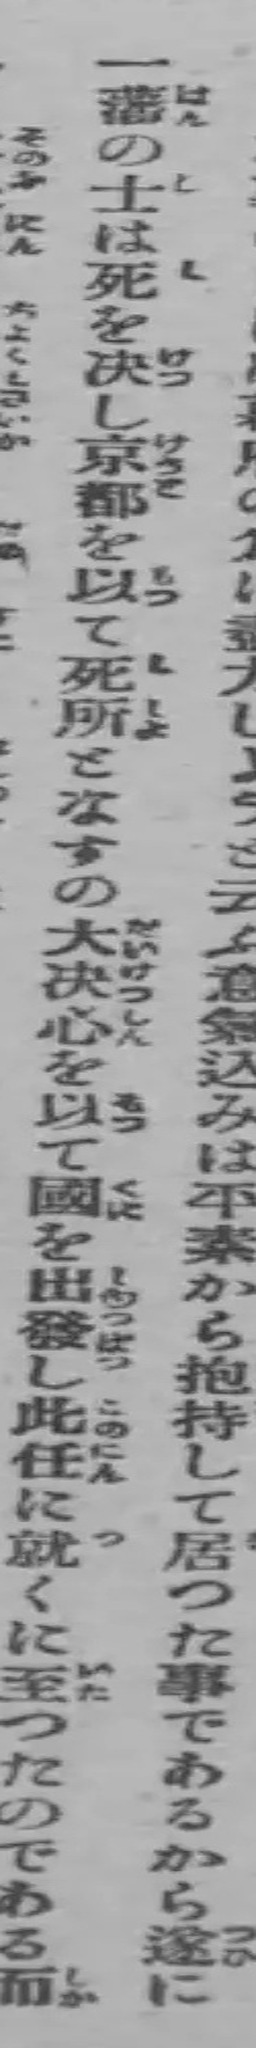一藩の士は死を決し京都を以て死所となすの大決心を以て国を出発し此任に就くに至つたのである而
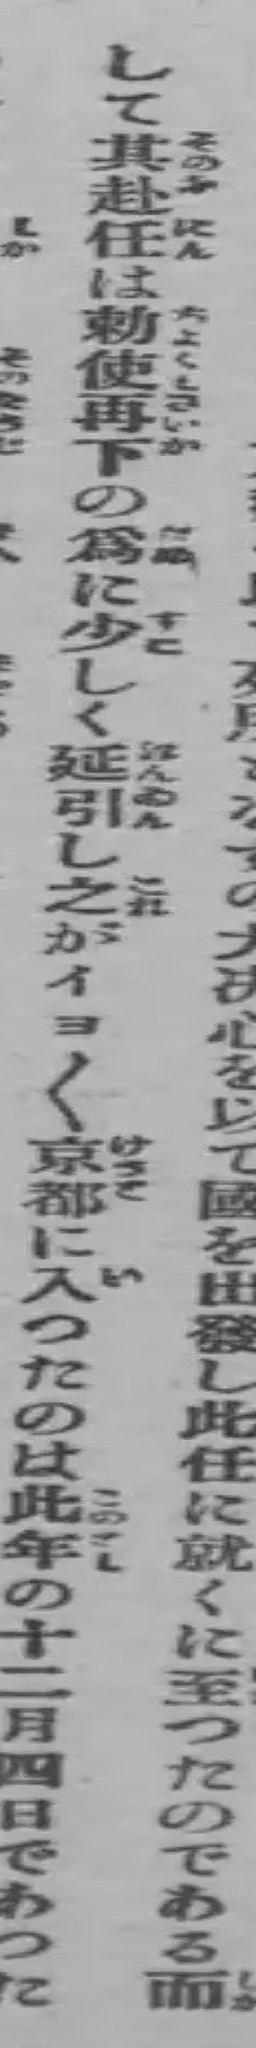して其赴任は勅使再下の為に少しく延引し之がイヨ〳〵京都に入つたのは此年の十二月四日であつた
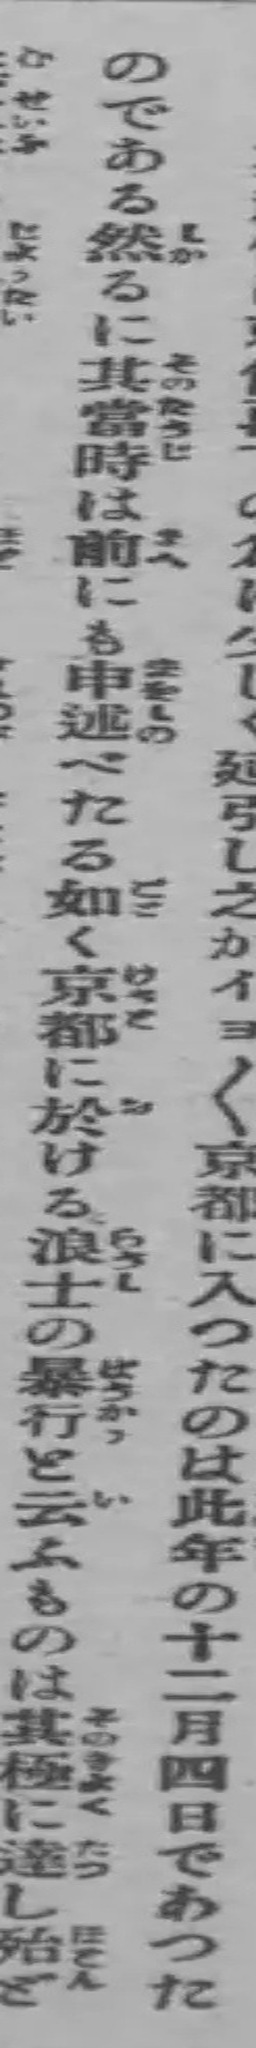のである然るに其当時は前にも申述べたる如く京都に於ける浪士の暴行と云ふものは其極に達し殆ど
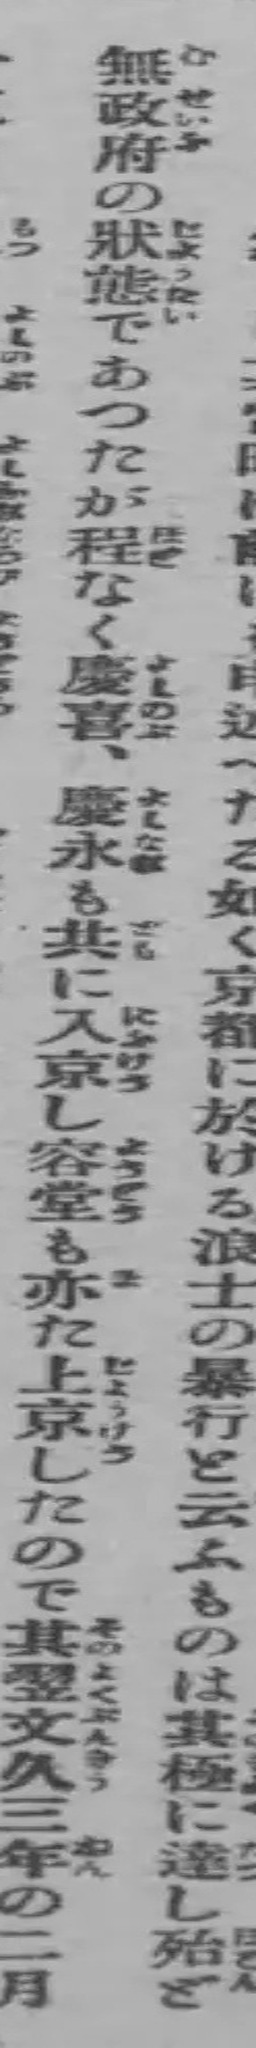無政府の状態であつたが程なく慶喜、慶永も共に入京し容堂も亦た上京したので其翌文久三年の二月
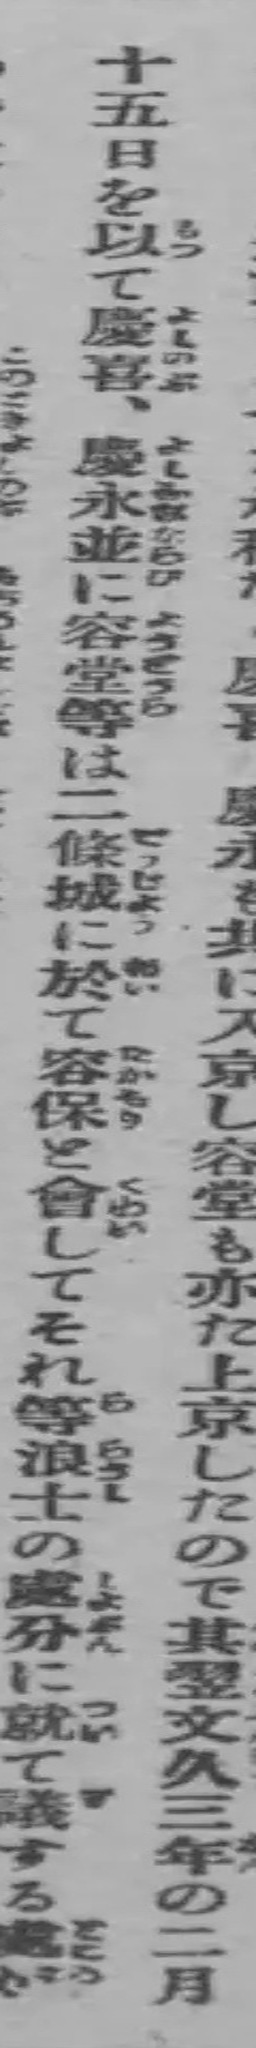十五日を以て慶喜、慶永並に容堂等は二条城に於て容保と会してそれ等浪士の処分に就て議する処が
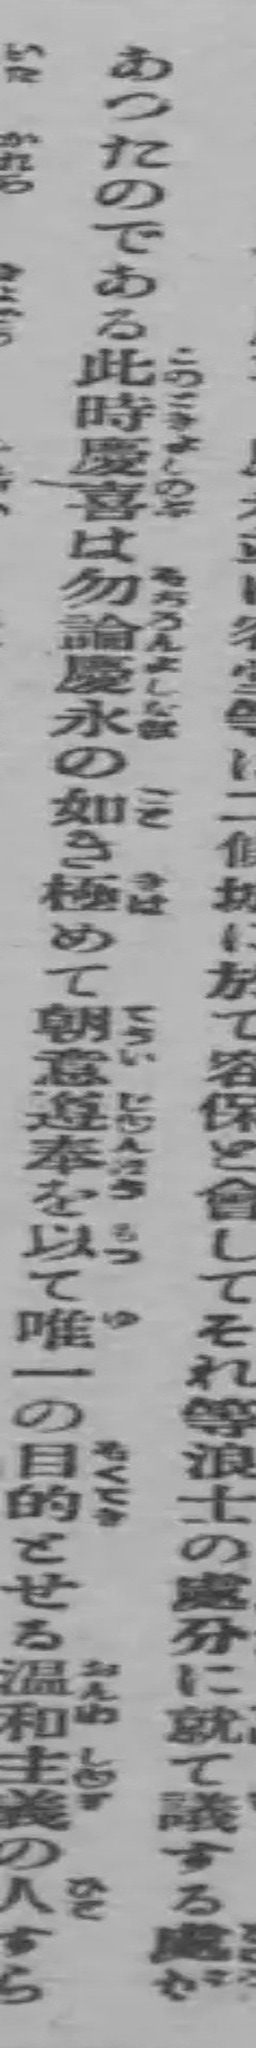あつたのである此時慶喜は勿論慶永の如きは極めて朝意遵奉を以て唯一の目的とせる温和主義の人すら
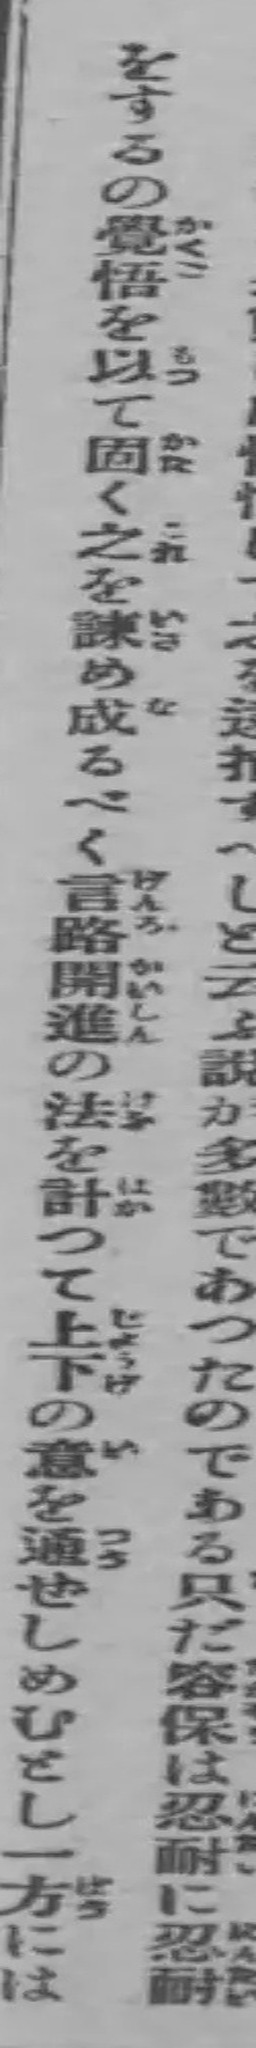をするの覚悟を以て固く之を諌め成るべく言路開進の法を計つて上下の意を通ぜしめむとし一方には
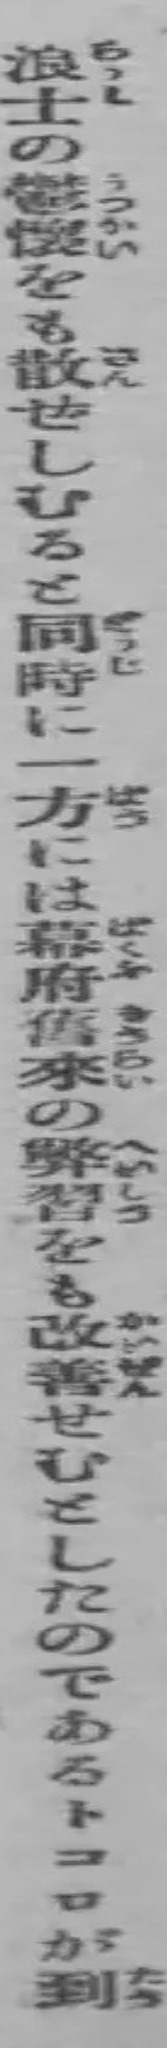浪士の鬱懐をも散ぜしむると同時に一方には幕府旧来の弊習をも改善せむとしたのであるトコロが到
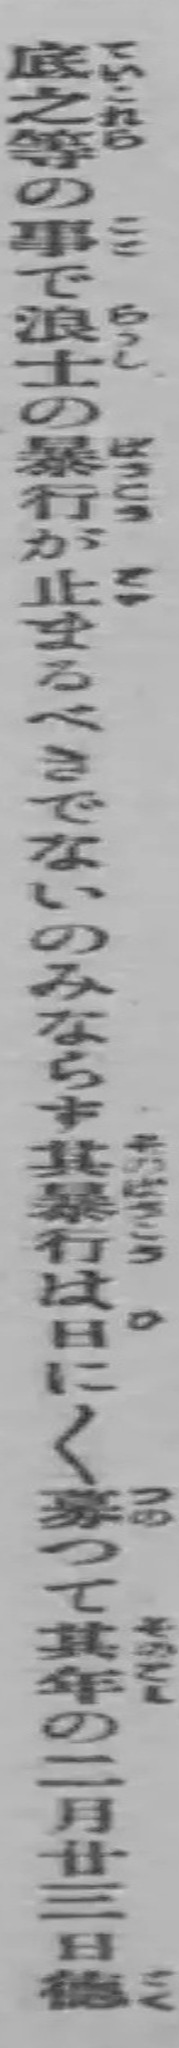底之等の事で浪士の暴行が止まるべきでないのみならず其暴行は日に〳〵募つて其年の二月廿三日徳
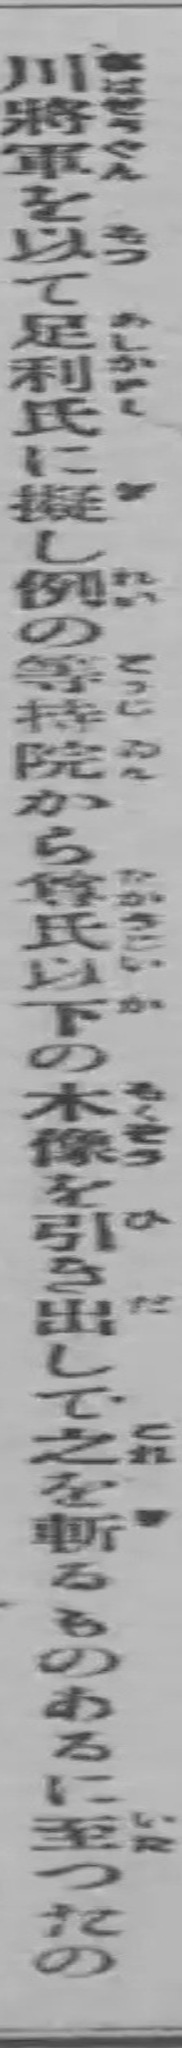川将軍を以て足利氏に擬し例の等持院から尊氏以下の木像を引き出して之を斬るものあるに至つたの
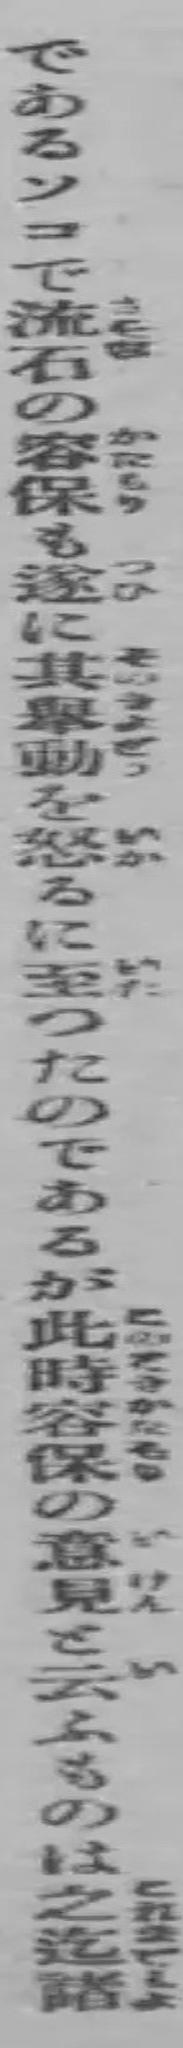であるソコで流石の容保も遂に其挙動を怒るに至つたのであるが此時容保の意見と云ふものは之迄諸
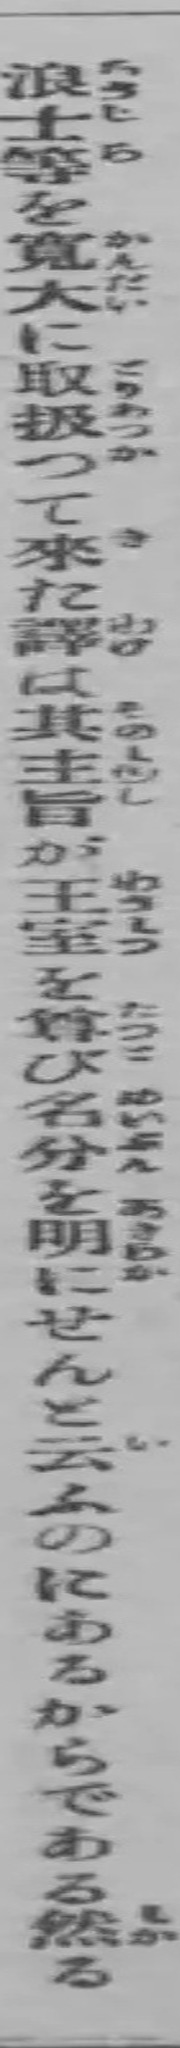浪士等を寛大に取扱つて来た訳は其主旨が王室を尊び名分を明にせんと云ふのにあるからである然る
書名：豊橋市史談
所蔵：国立国会図書館 National Diet Library, JAPAN
